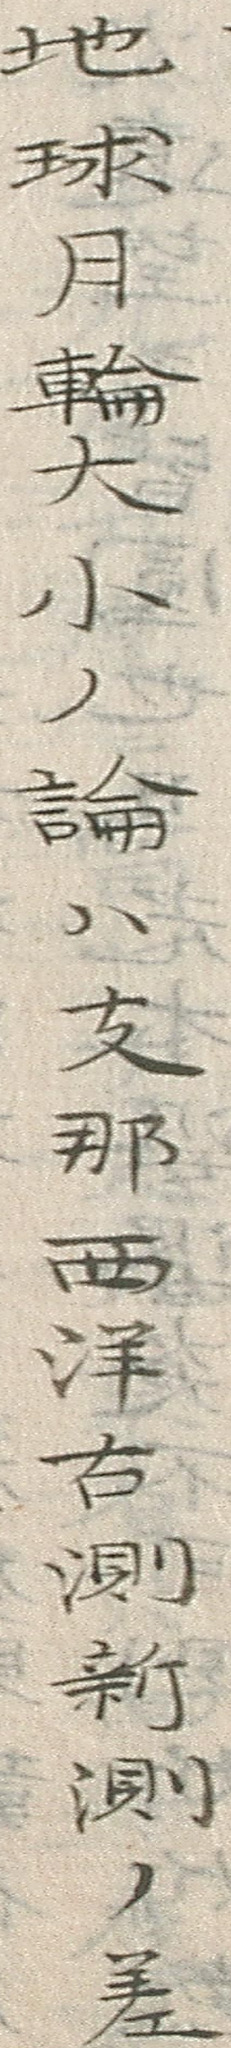地球月輪大小ノ論ハ支那西洋古測新測ノ差
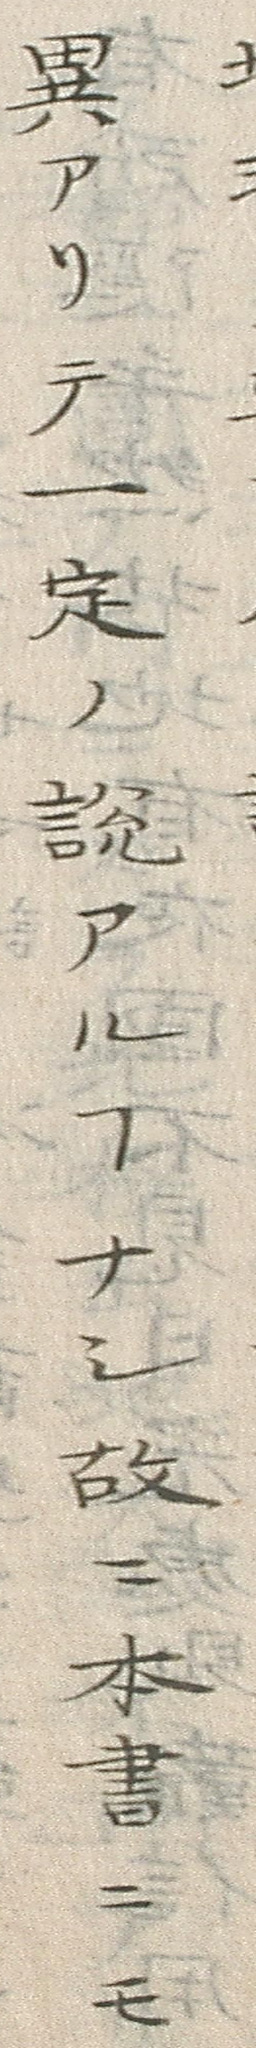異アリテ一定ノ説アルコトナシ故ニ本書ニモ
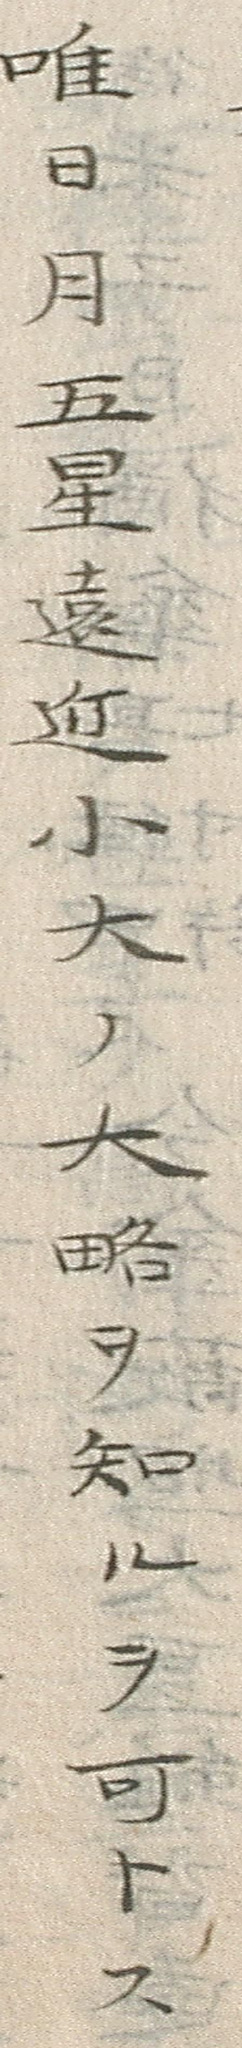唯日月五星遠近小大ノ大略ヲ知ルヲ可トス
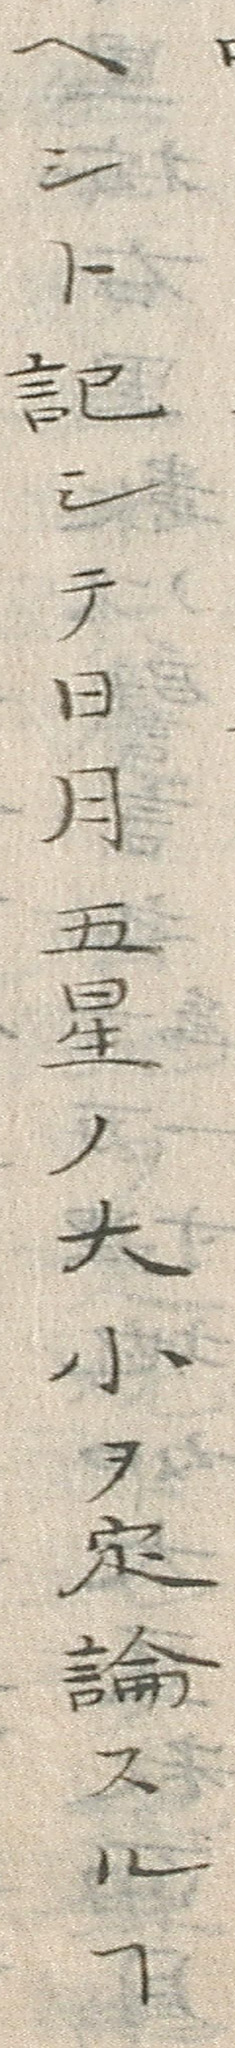ヘシト記シテ日月五星ノ大小ヲ定論スルコト
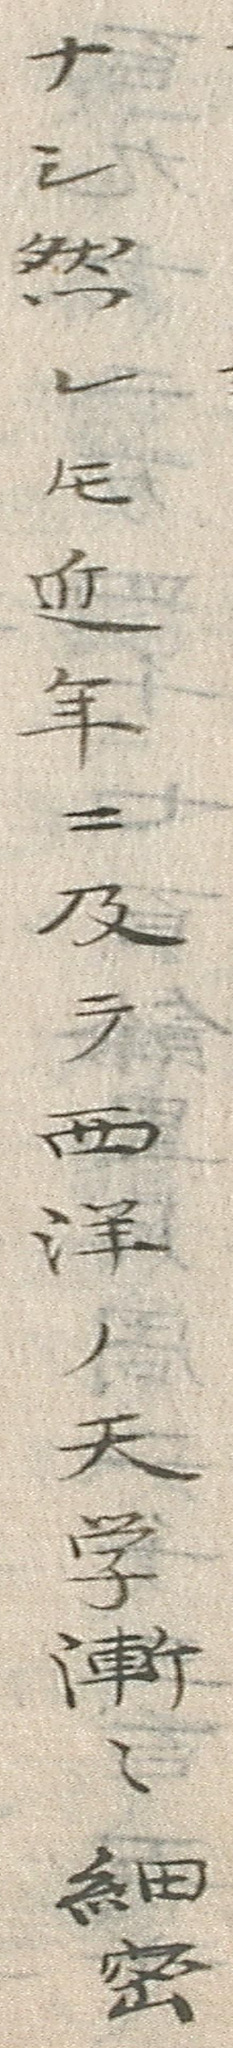ナシ然レトモ近年ニ及テ西洋ノ天学漸〻細密
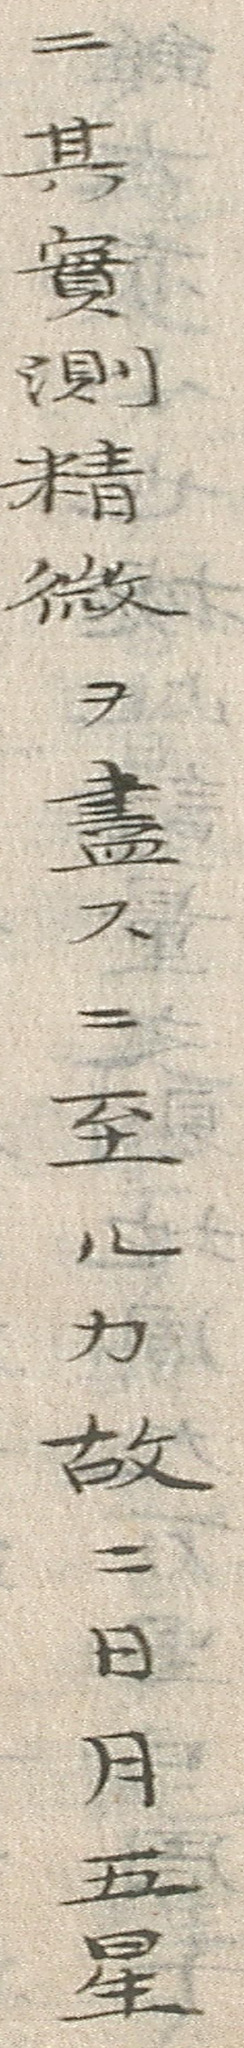ニ其実測精微ヲ尽スニ至ルカ故ニ日月五星
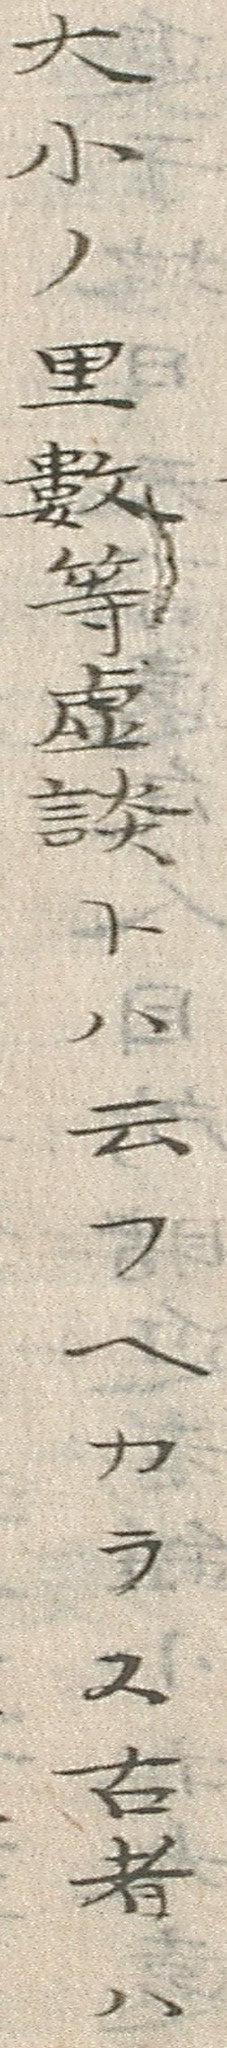大小ノ里数等虚談トハ云フヘカラス古者ハ
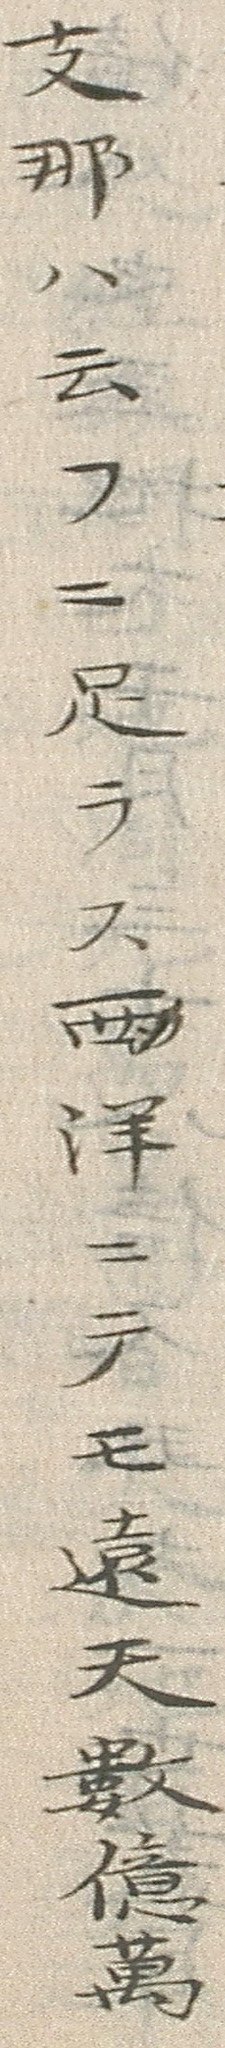支那ハ云フニ足ラス西洋ニテモ遠天数億万
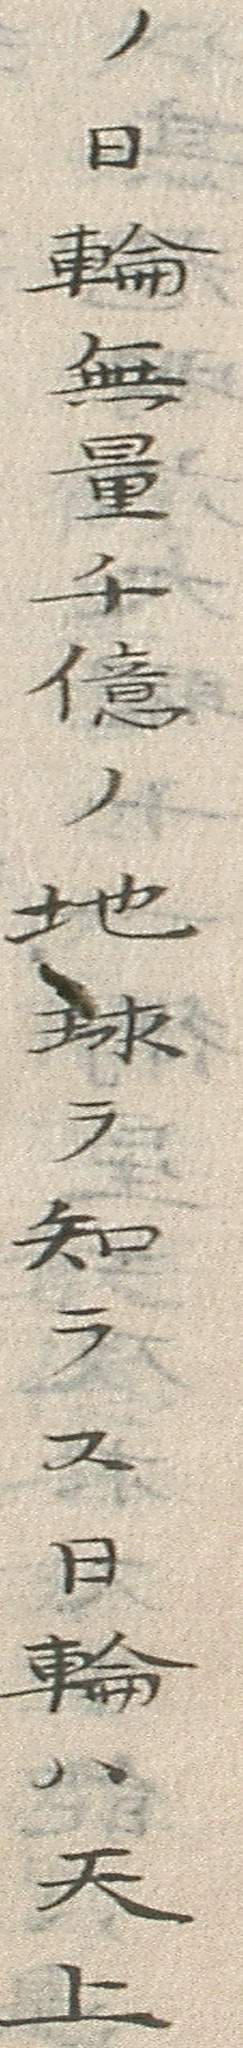ノ日輪無量千億ノ地球ヲ知ラス日輪ハ天上
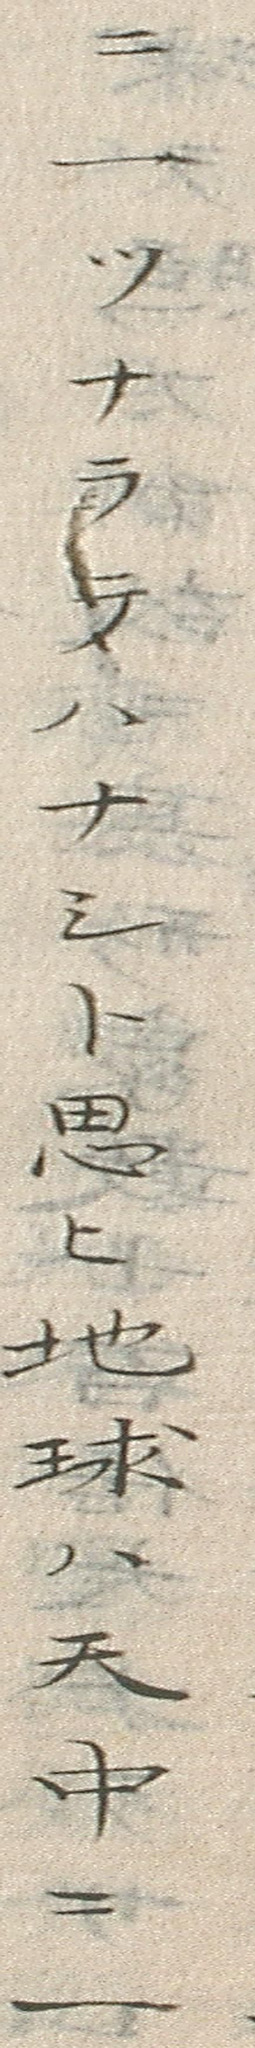ニ一ツナラテハナシト思ヒ地球ハ天中ニ一
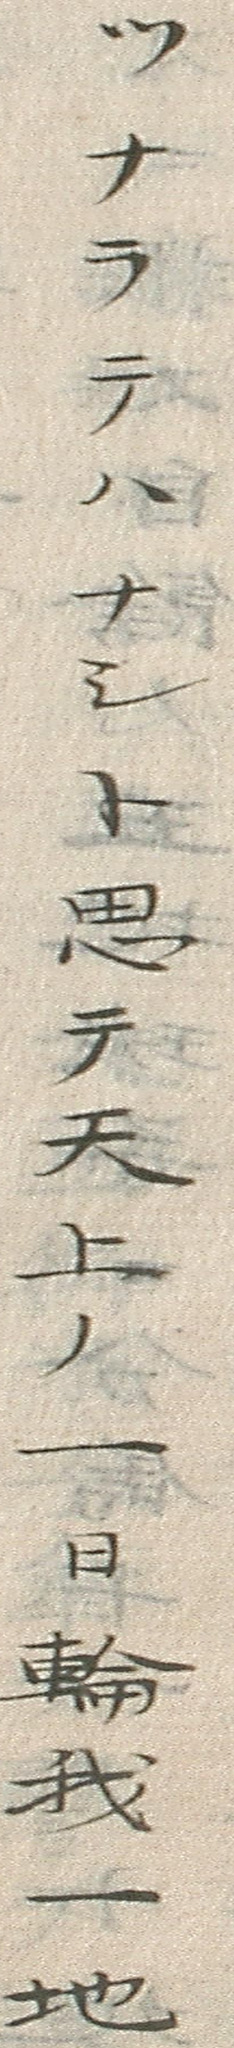ツナラテハナシト思テ天上ノ一日輪我一地
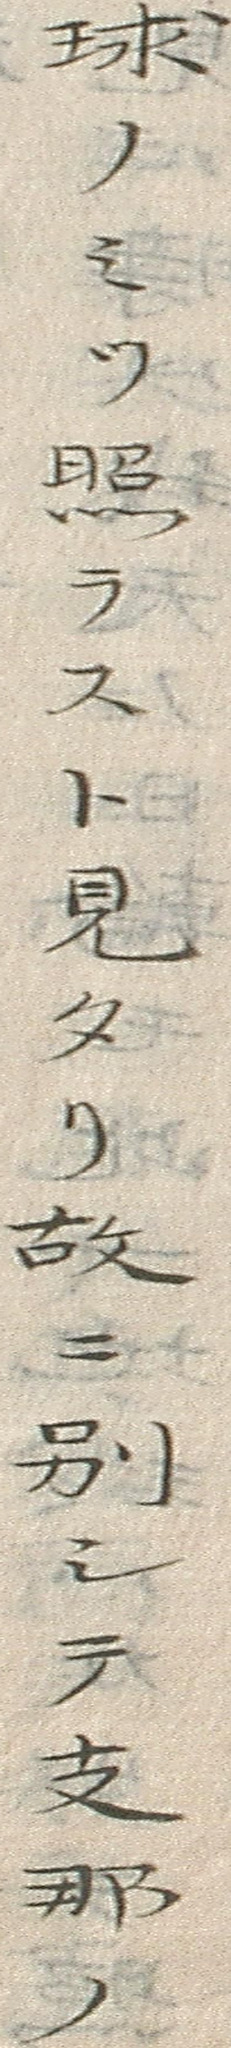球ノミツ照ラスト見タリ故ニ別シテ支那ノ
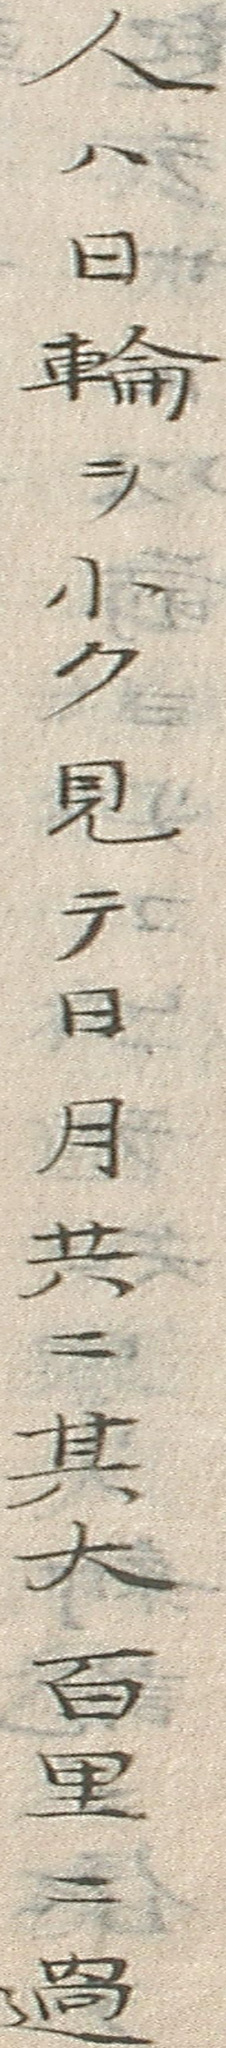人ハ日輪ヲ小ク見テ日月共ニ其大百里ニ過
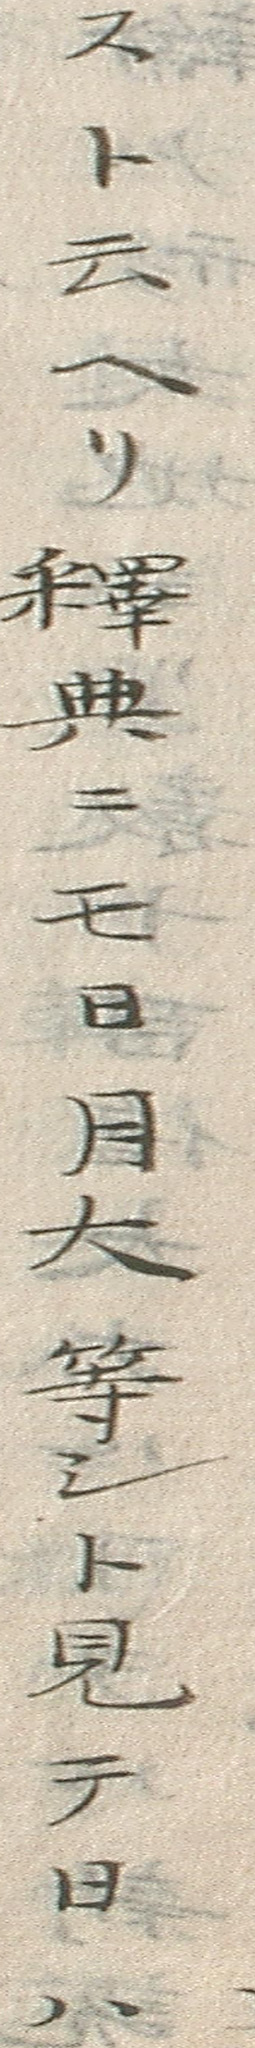スト云ヘリ釈典ニモ日月大等シト見テ日ハ
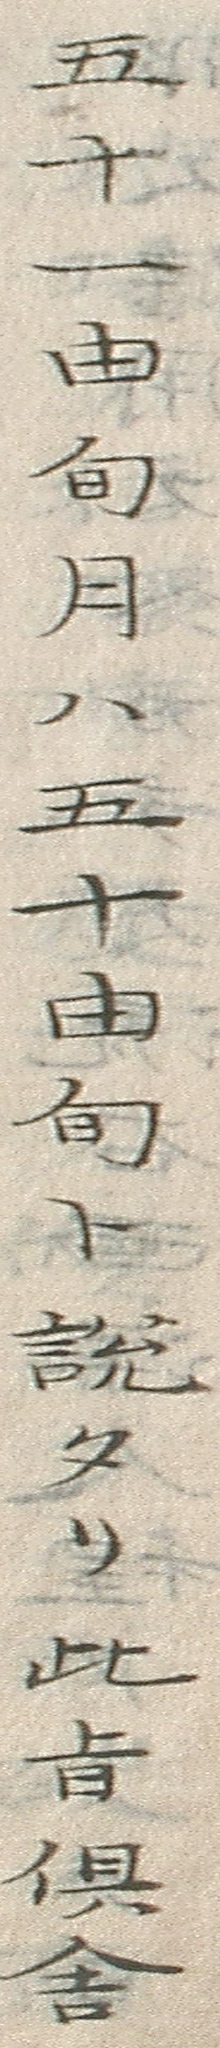五十一由旬月ハ五十由旬ト説タリ此旨倶舎
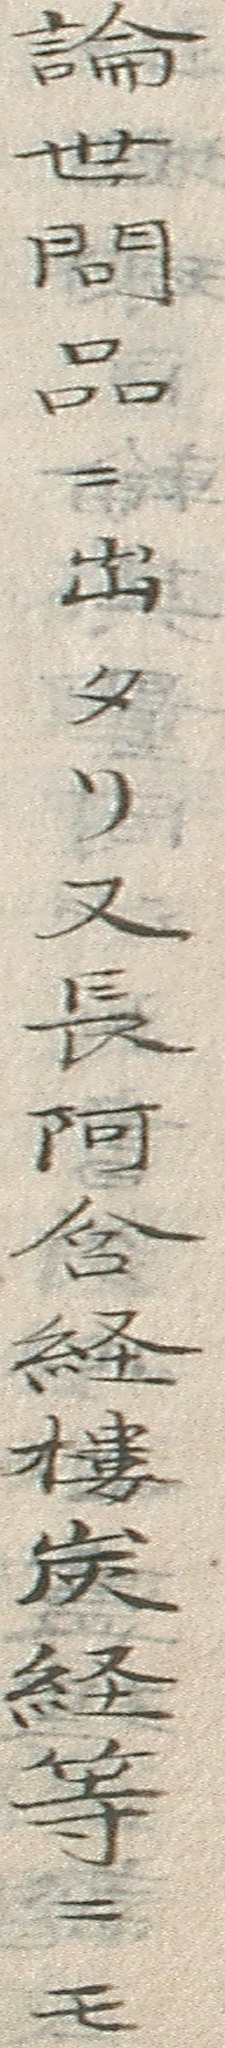論世間品ニ出タリ又長阿含経楼炭経等ニモ
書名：天學略名目羽翼　全
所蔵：東京大学地震研究所図書室 Earthquake Research Institute Library, The University of Tokyo, JAPAN
